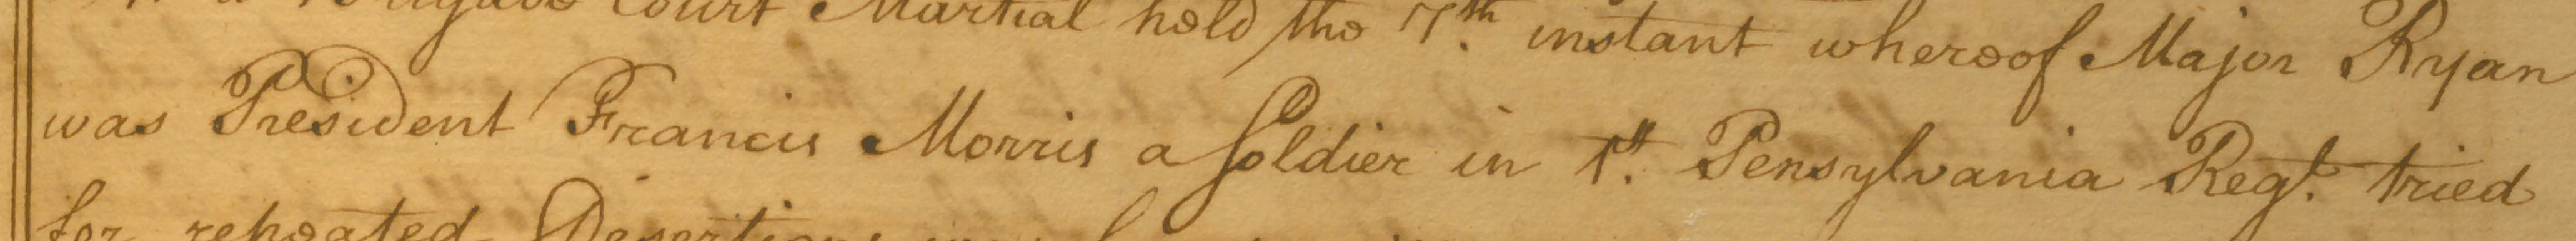was President Francis Morris a Soldier in 1^st. Pensylvania Reg^t. tried
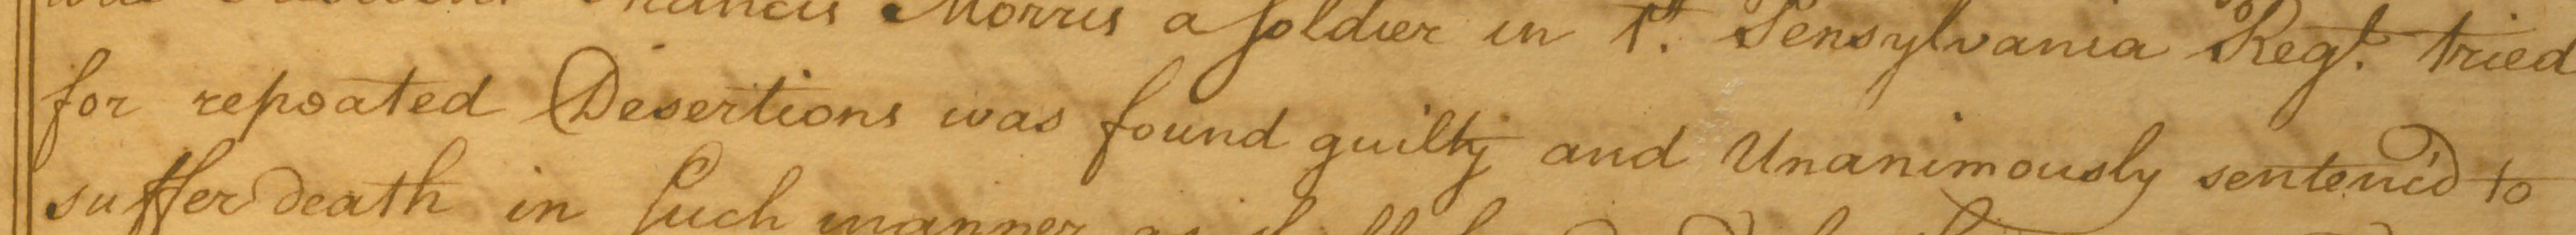for repeated Desertions was found guilty and Unanimously sentenc'd to
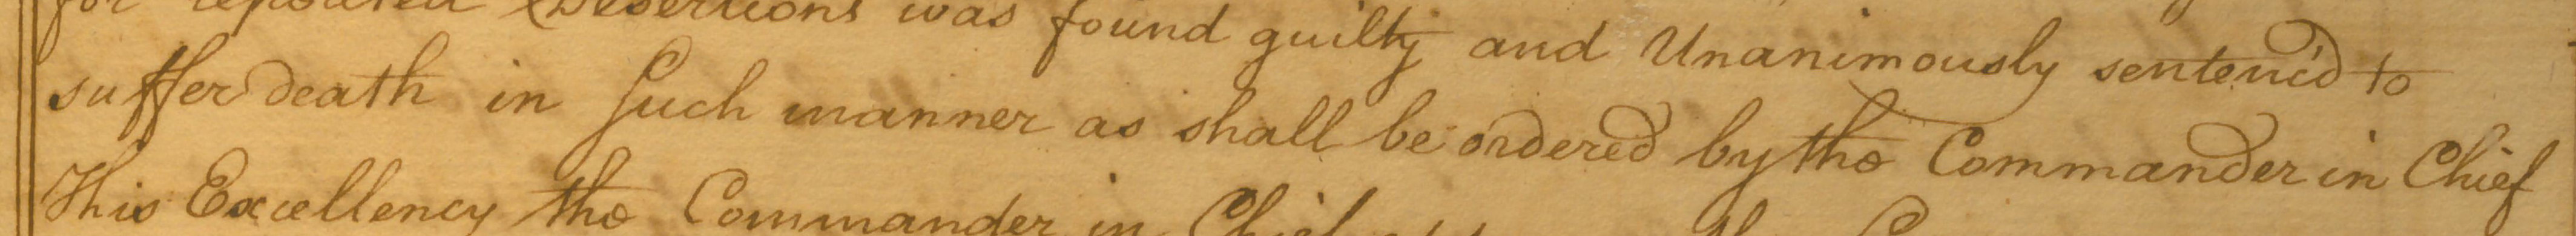suffer death in such manner as shall be ordered by the Commander in Chief
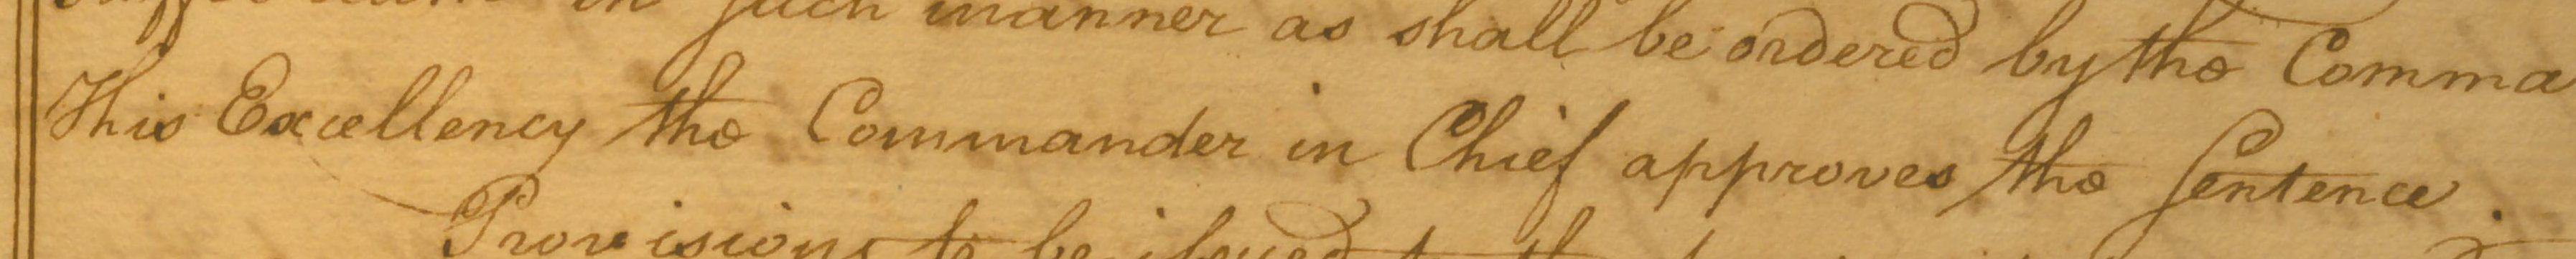His Excellency the Commander in Chief approves the Sentence.
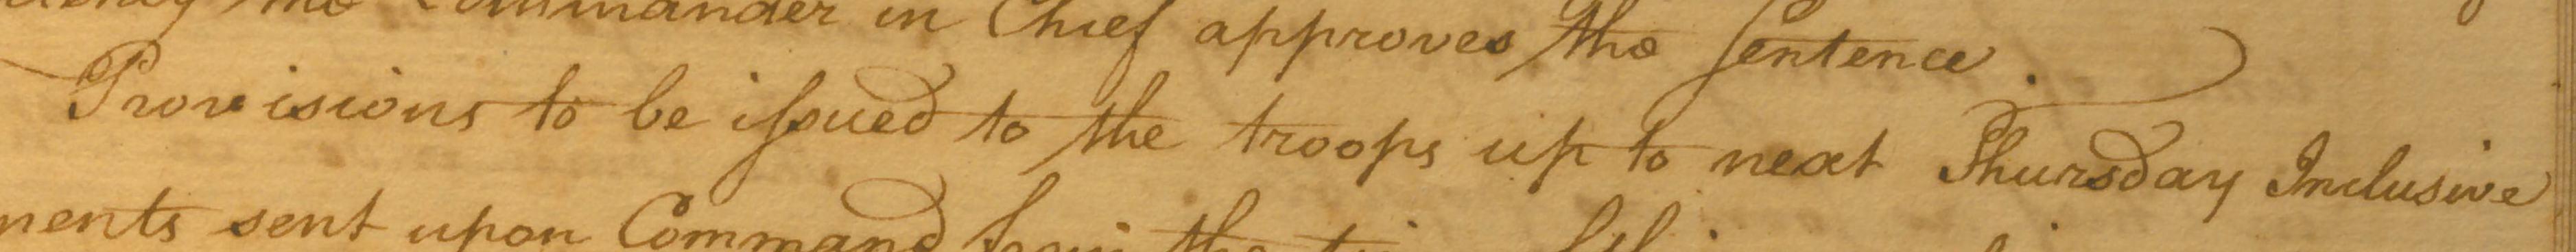Provisions to be issued to the troops up to next Thursday Inclusive
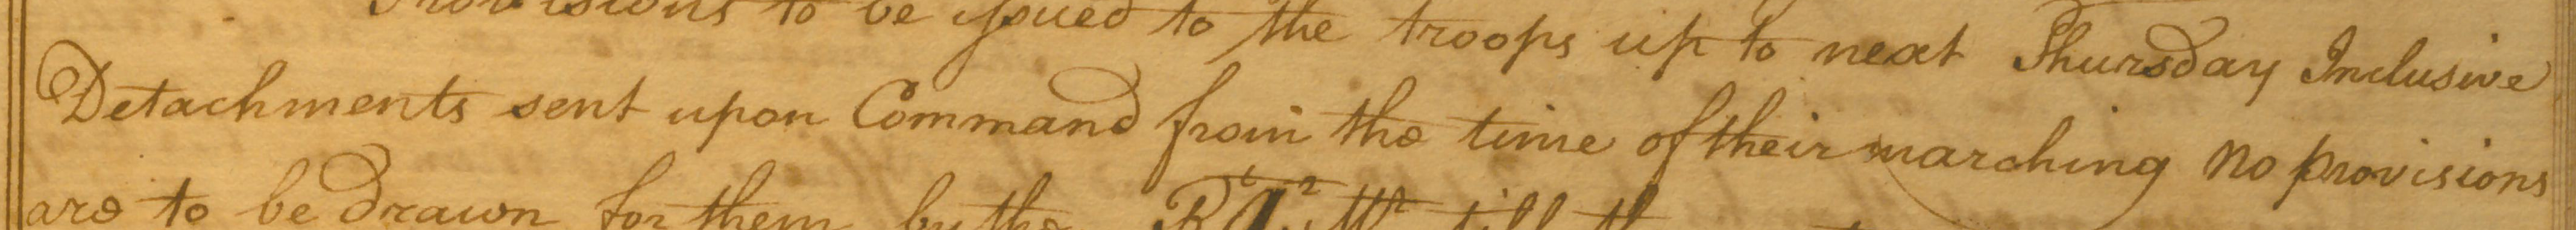Detachments sent upon Command from the time of their marching no provisions
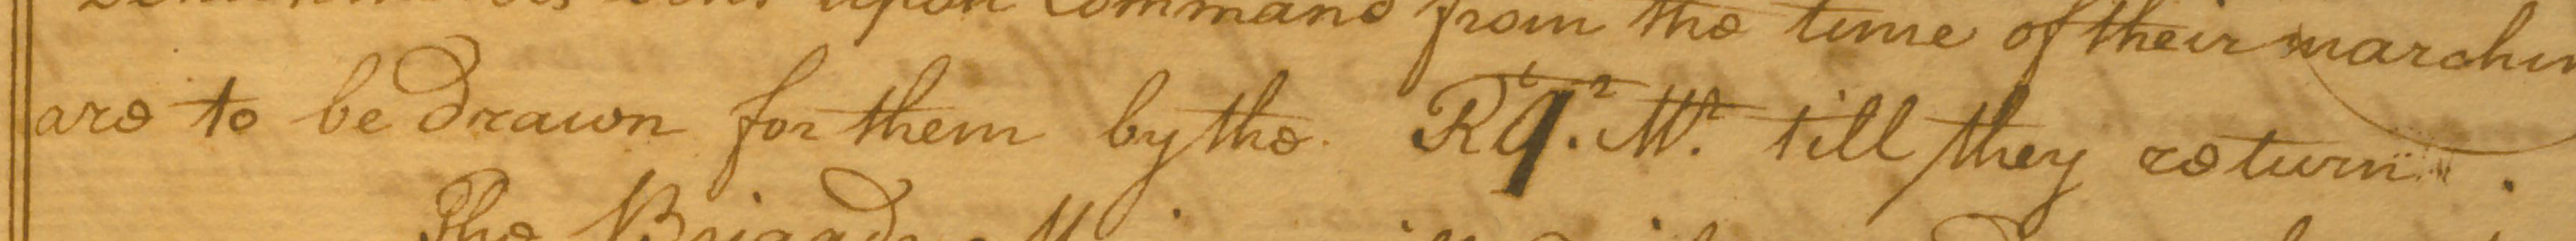are to be drawn for them by the R^t. Q^r. M^r. till they return.
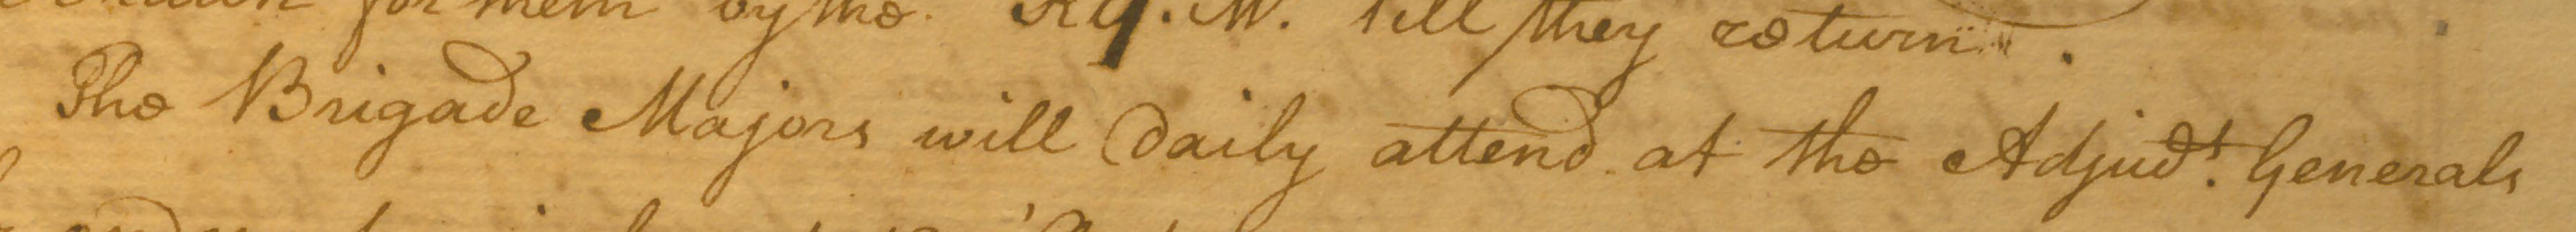The Brigade Majors will daily attend at the Adjud^t. Generals
